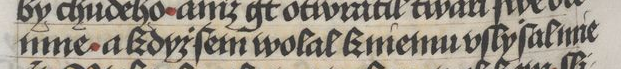mie.a když ſem wolal k niemu vſlyẛal mie
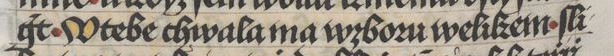ḡt.Vtebe chwala ma wzboru welikem.ſli¬
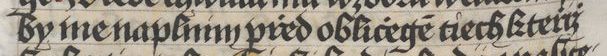by me naplnim před obliċege tiech kteṙiż
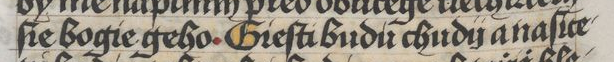ſie bogie geho.Gíeſti budú chudij a naſice¬
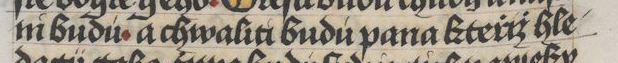ni budú.a chwaliti budú pana kteṙiż hle¬
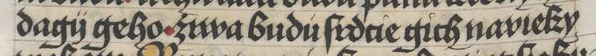dagij geho.żiwa budú ſrdce gich navieky
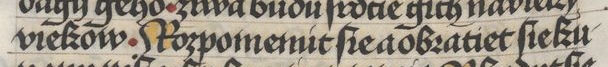viekow.Rozpomenút ſie a obratiet ſie ku¬
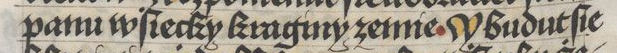panu wẛiecky kraginy zemie.Y budutſie
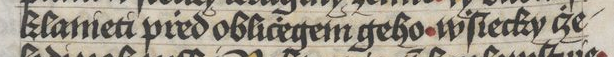klanieti pṙed obliċegem geho.wẛiecky cże¬
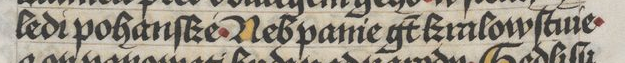ledi pohanſké.Neb panie ḡt kralowſtvie.
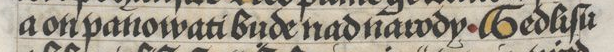a on panowati bude nad narody.Gedliſu
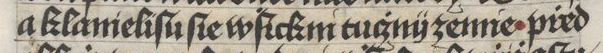a klanieliſú ſie wẛickni tucżnij zemie.pṙed
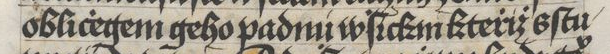obliċegem geho padnú wẛickni kteṙiż sſtu¬
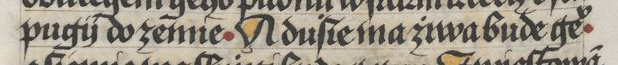pugij do zemie. A duẛie ma żiwa bude gev.
